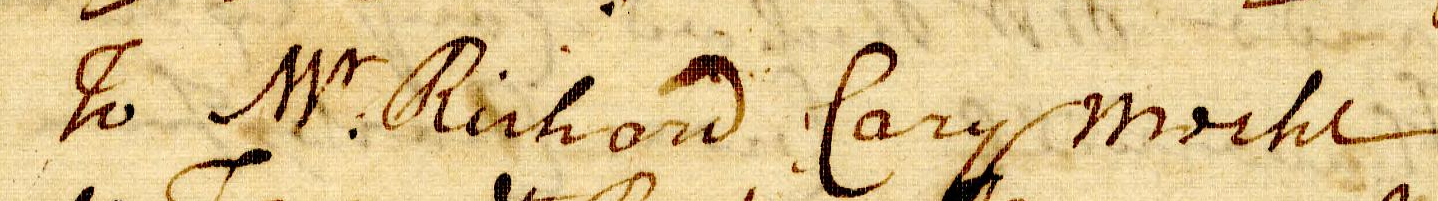To M^r. Richard Cary mercht
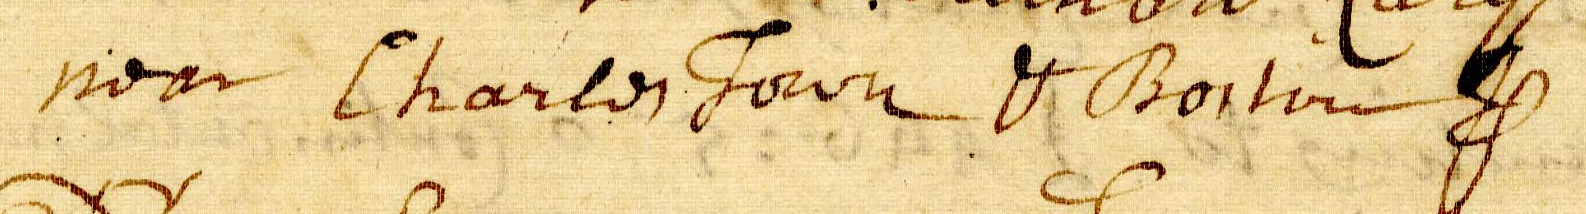poor Charles Town & Boston
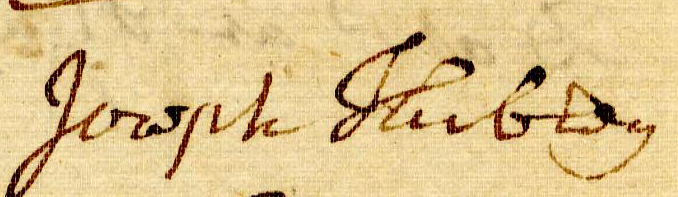Joseph Hubley
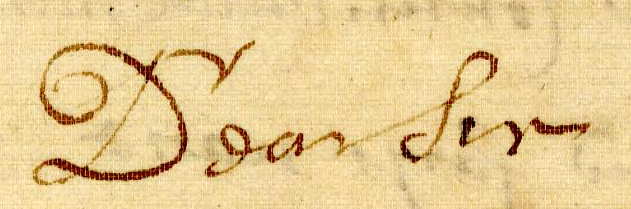Dear Sir
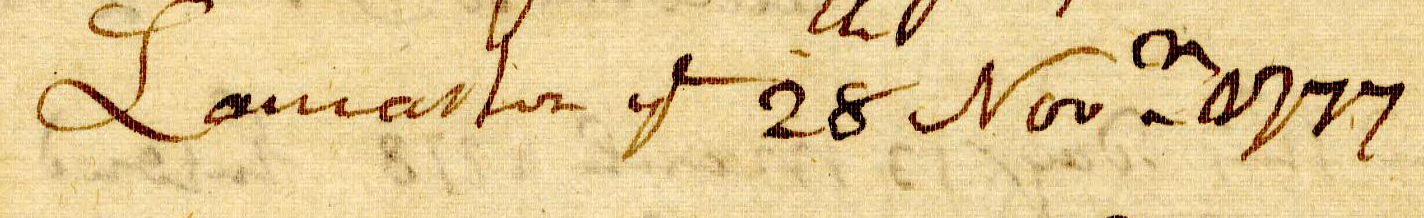Lancaster y^e 28 Nov^r. 1777
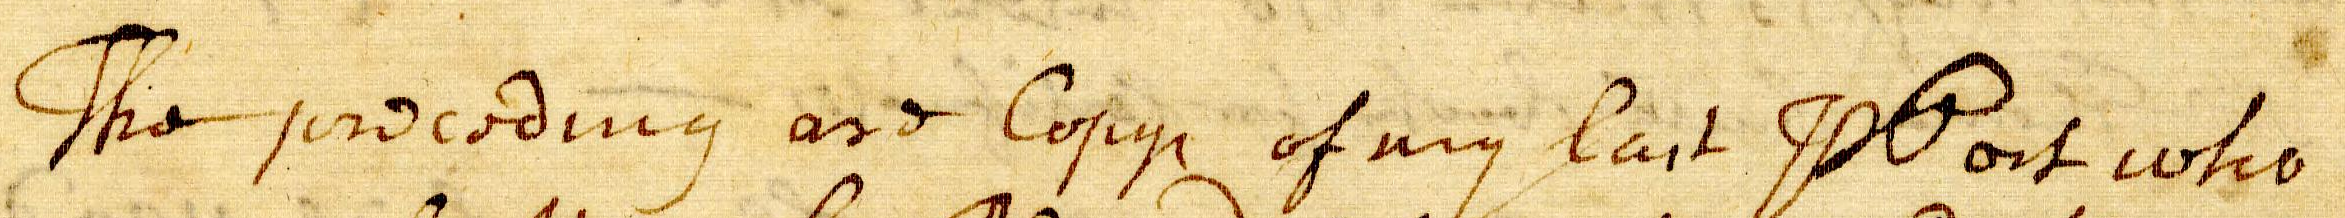The precoding are Copys of my last per Post who
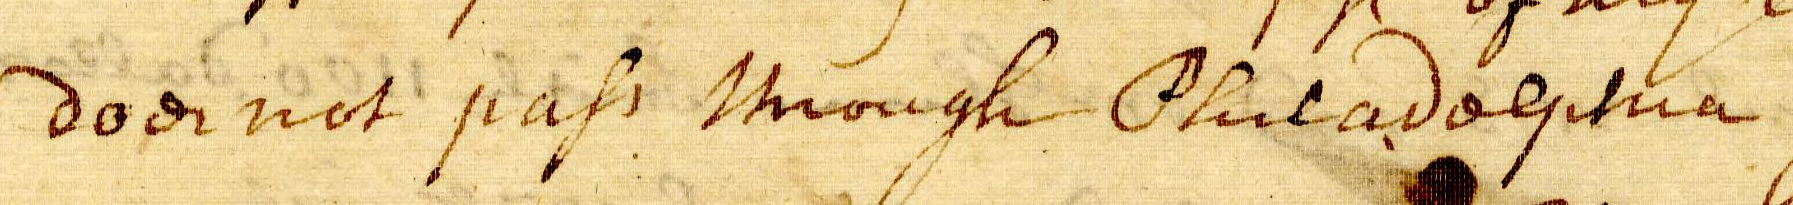does not pass through Philadelphia
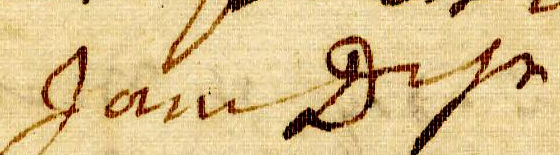I am D^r s^r
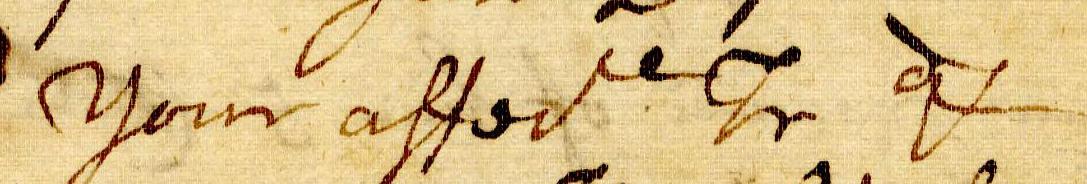Your affec^e Fr &
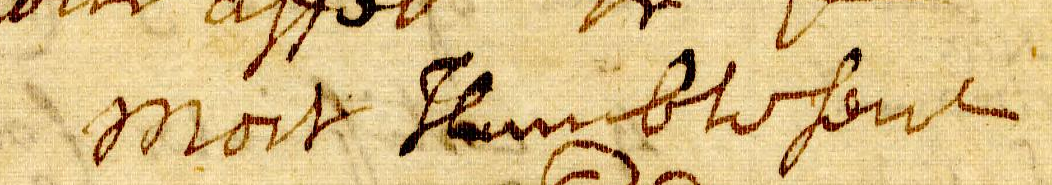Most Humble Sert
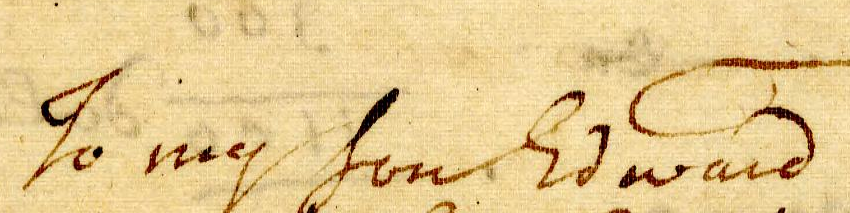To my son Edward
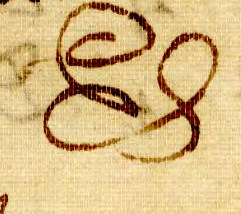ES
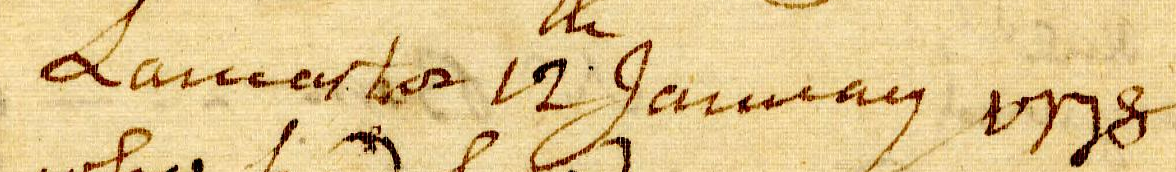Lancaster 12^th January 1778
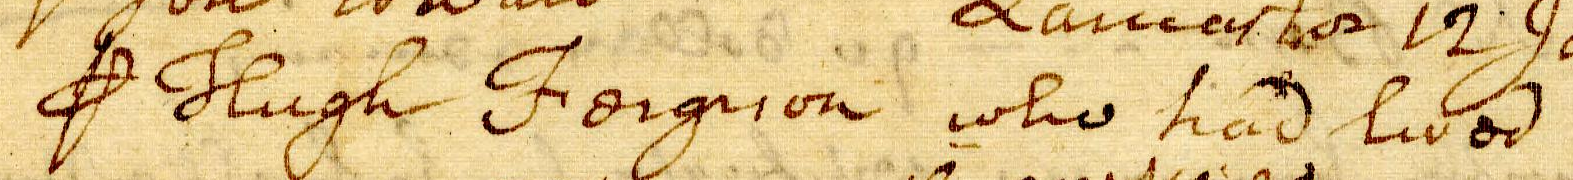per Hugh Fergison who had lived
